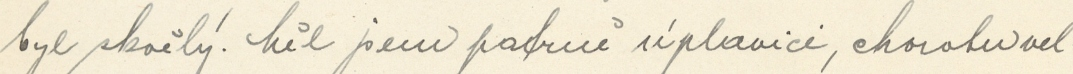byl skvělý. Měl jsem patrně úplavici, chorobu vel-
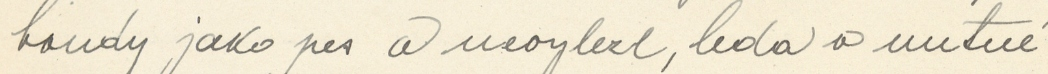boudy jako pes a nevylezl, leda v nutné
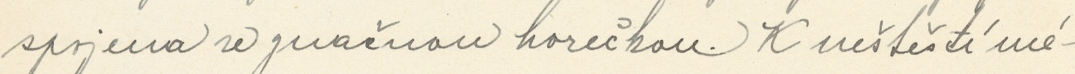spojena se značnou horečkou. K neštěstí mé-
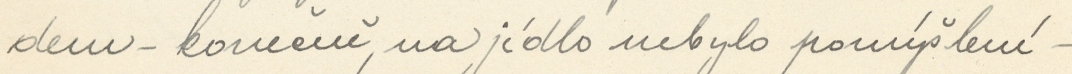dem - konečně na jídlo nebylo pomyšlení -
